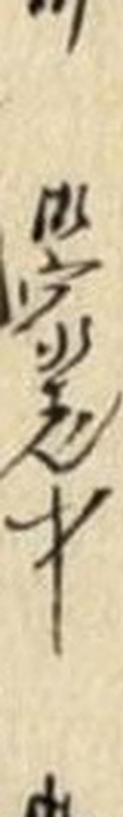御家老中息
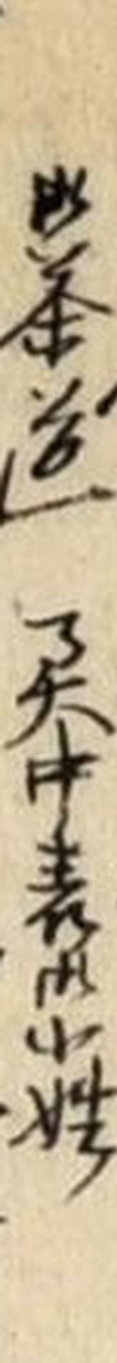御茶道奥中表御小姓
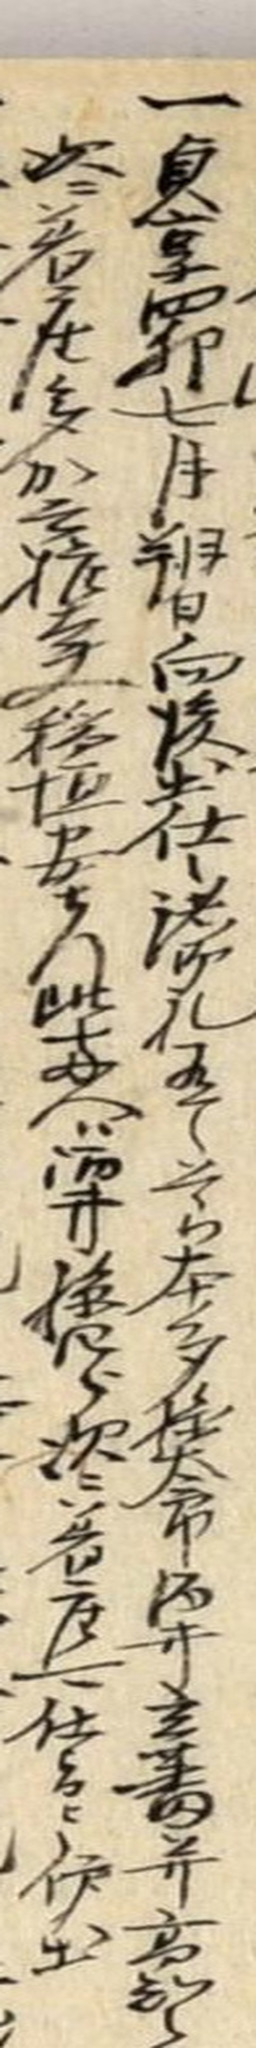次に着座多加谷権太夫稲垣安右衛門此両人は酒井孫四郎次に着座可仕旨に被仰出
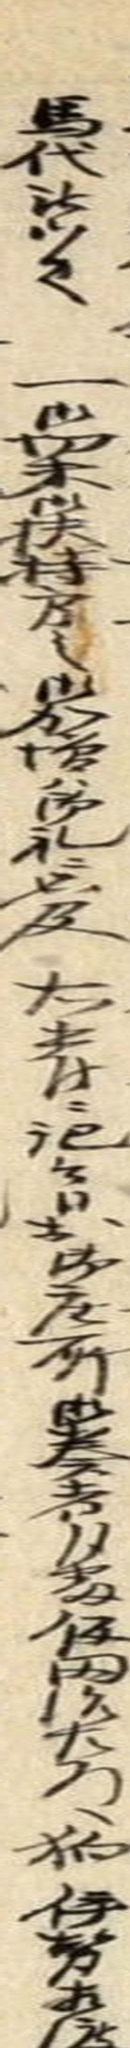馬代銀弐匁一御切米御扶持方之御加増は御礼に不及右書付に記今日於御座所御奏者月番飯田作左衛門へ狛伊勢相渡之

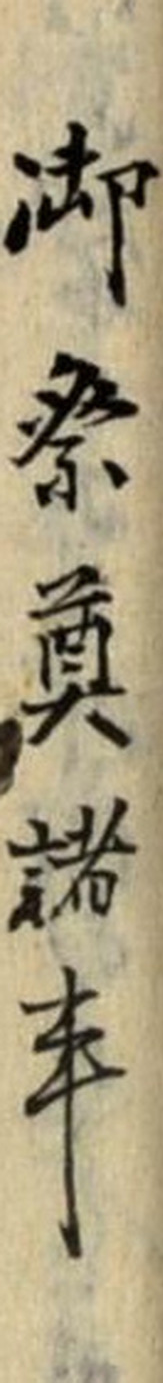御祭奠諸事
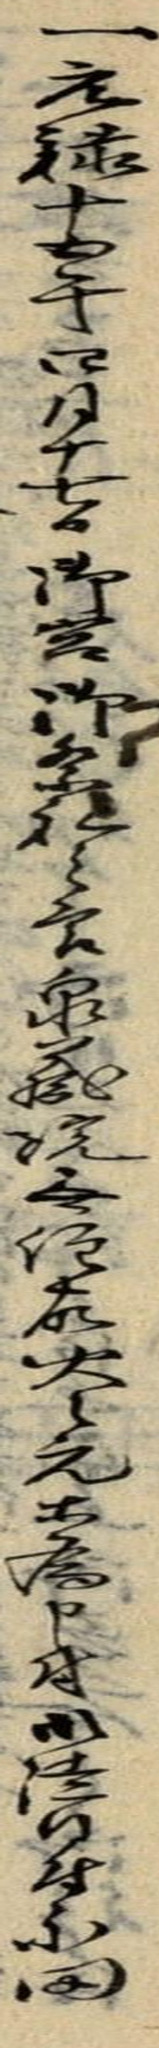一元禄十五年四月十七日御宮御祭礼之節泉蔵院無住故火之元等為申付御徒目付永田
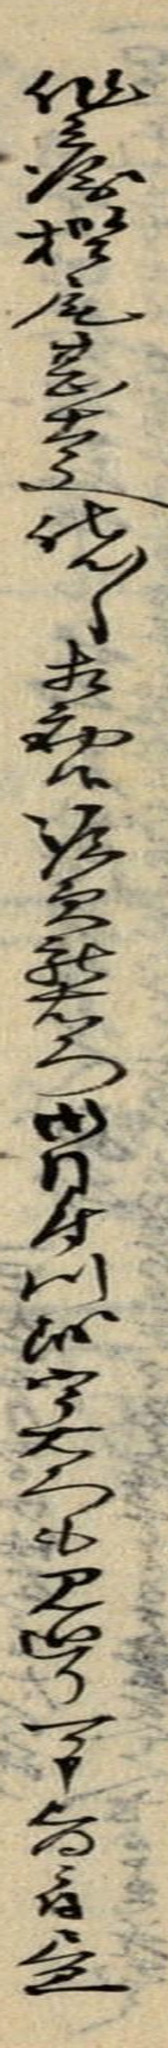作兵衛樫尾甚太夫代る〳〵相勤候渥美新右衛門御目付川越宇右衛門も見廻り可申旨に付昼
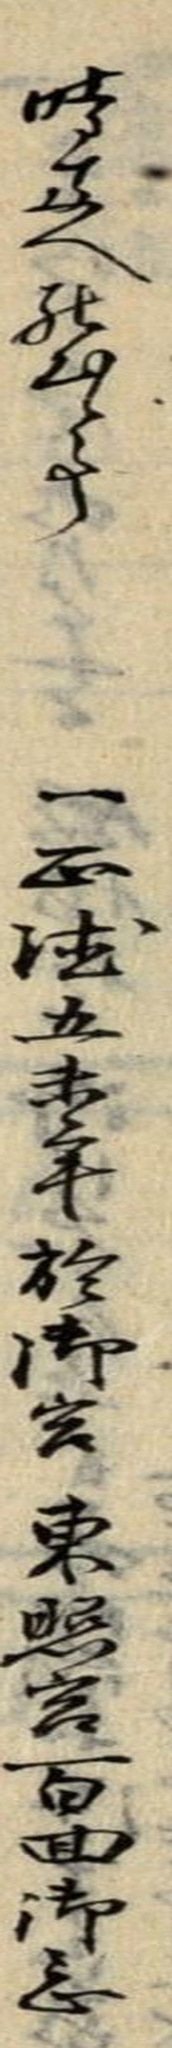時両人罷出候事一正徳五未年於御宮東照宮百回御忌
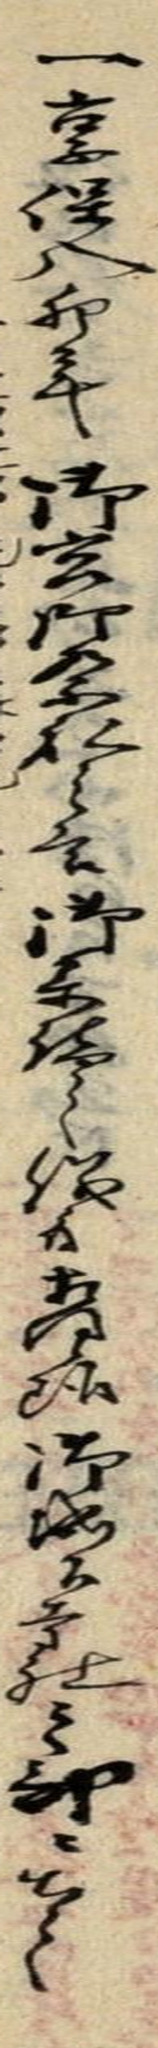一享保八卯年御宮御祭礼之節御参詣之儀に付相伺候趣御城下寺社之部に出之
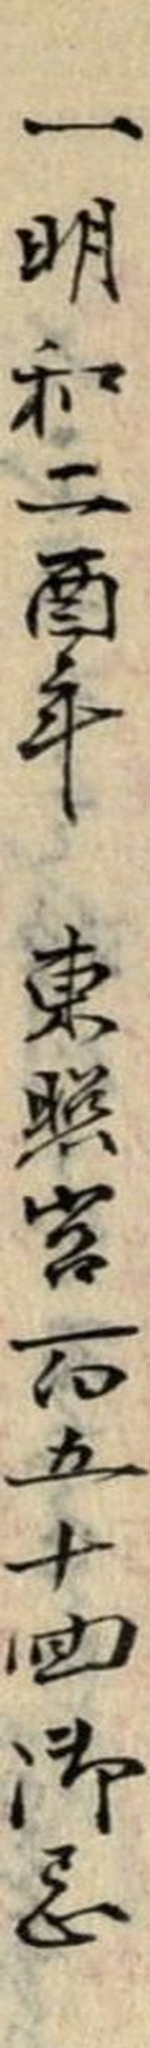一明和二酉年東照宮百五十回御忌
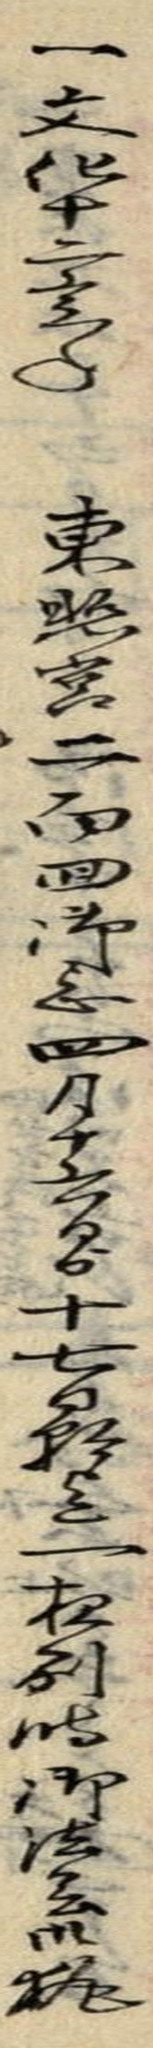一文化十二亥年東照宮二百回御忌四月十六日ゟ十七日朝迄一夜別時御法会御執
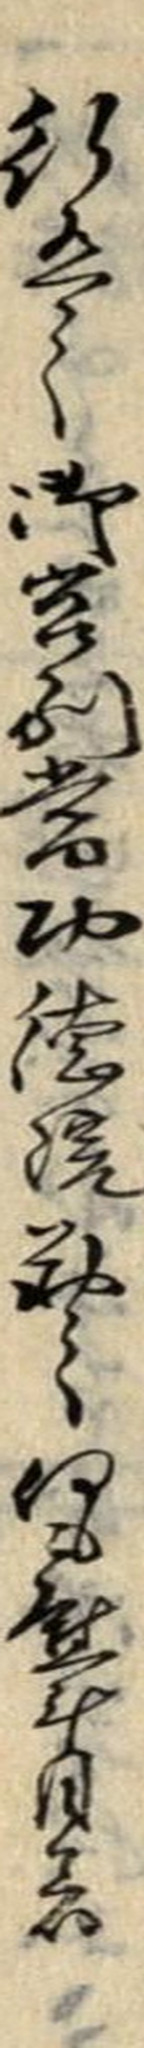行有之御宮別当功徳院勤之何も熨斗目着
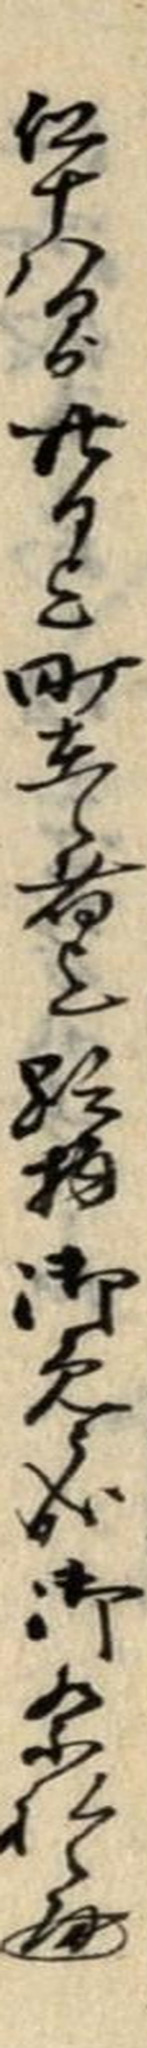但十八日ゟ廿日迄町在之者迄影拝御免被成御祭礼之通
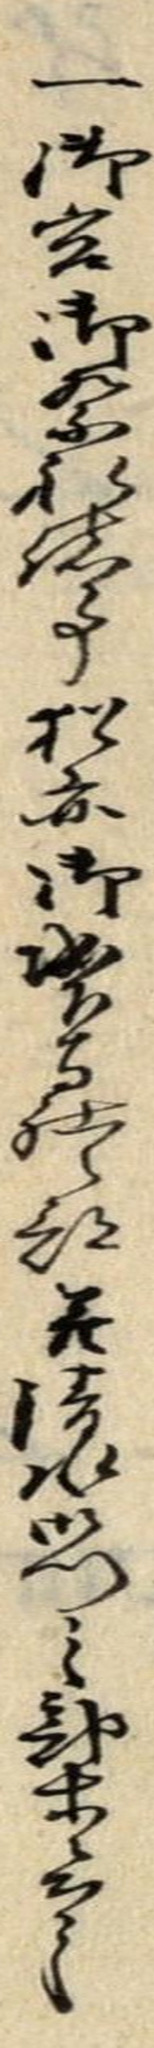一御宮御祭礼諸事猶亦御城下寺社之部并清水御門之部等に出之
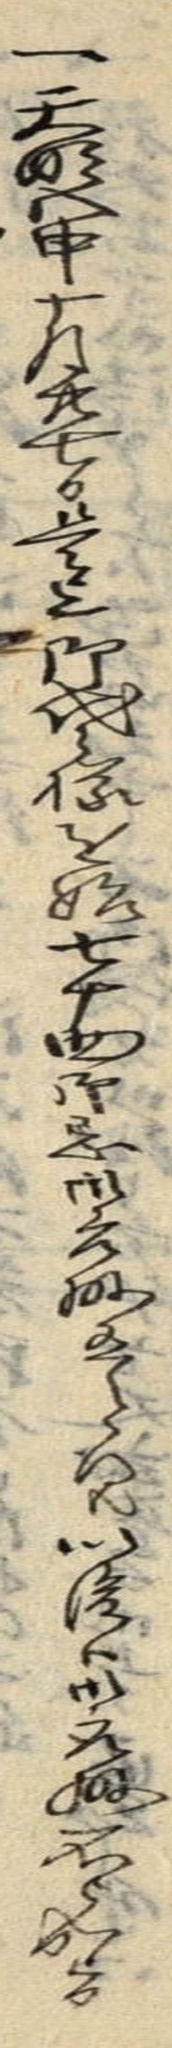一天明八申十月廿七日是迄御代々様を始七十回御忌御取扱有之候得共以後は御取扱不被成旨
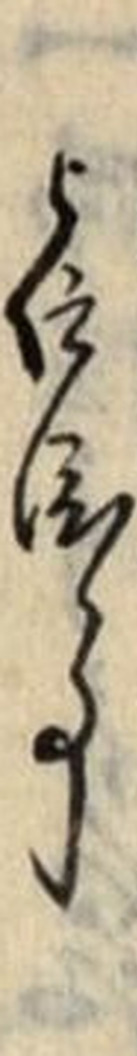被仰渡候事
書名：蒐輯之部
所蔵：福井県文書館 Fukui Prefectural Archives
